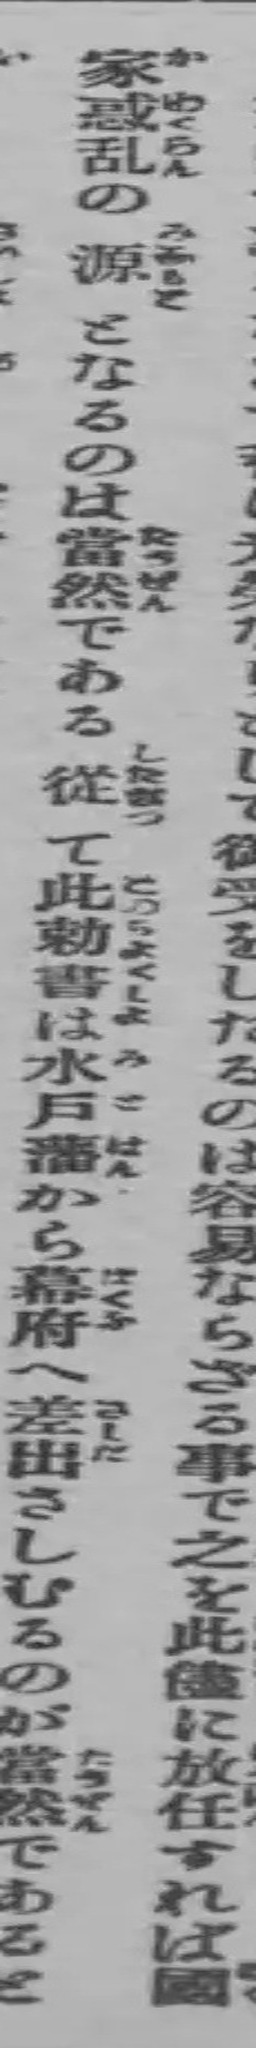家惑乱の源となるのは当然である従て此勅書は水戸藩から幕府へ差出さしむるのが当然であると
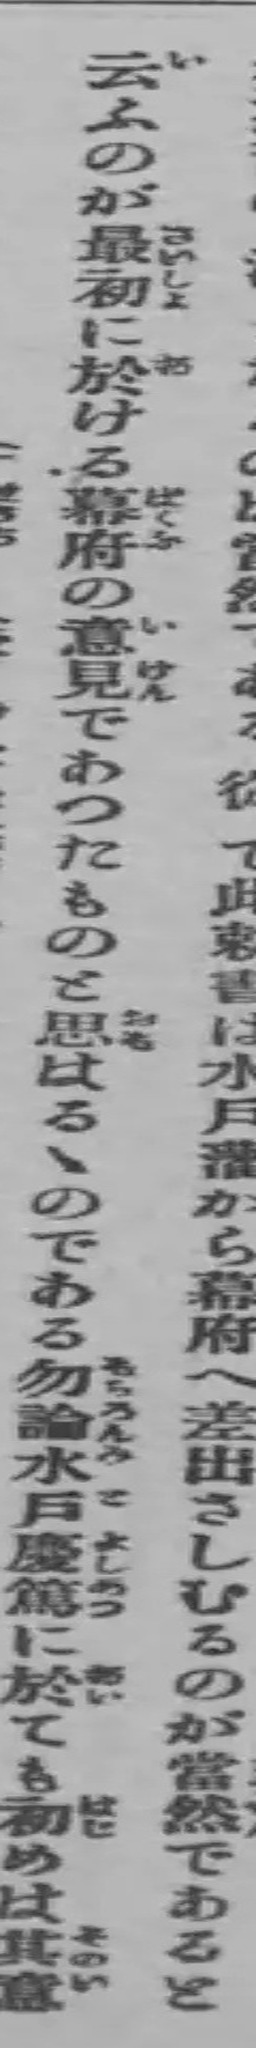云ふのが最初に於ける幕府の意見であつたものと思はるゝのである勿論水戸慶篤に於ても初めは其意
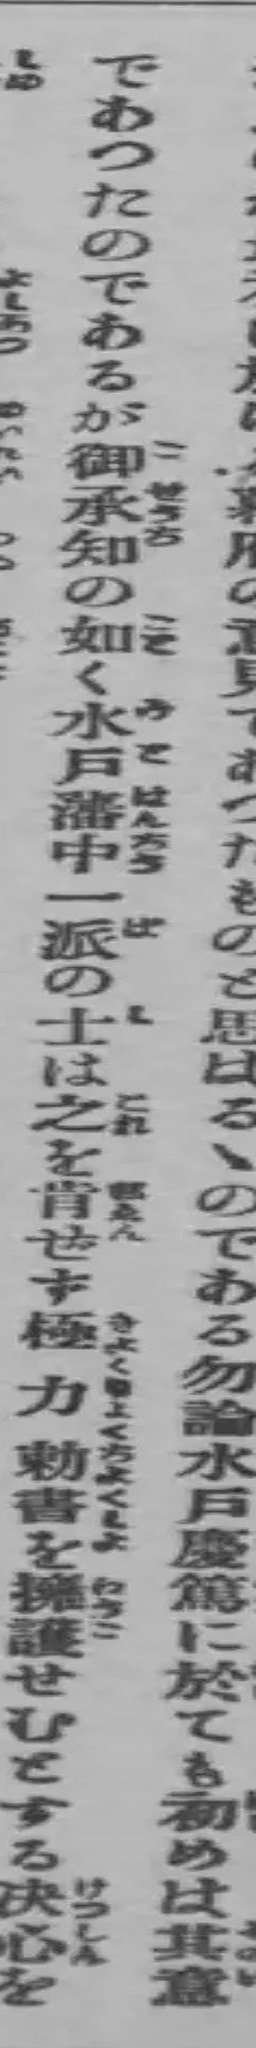であつたのであるが御承知の如く水戸藩中一派の士は之を肯ぜず極力勅書を擁護せむとする決心を
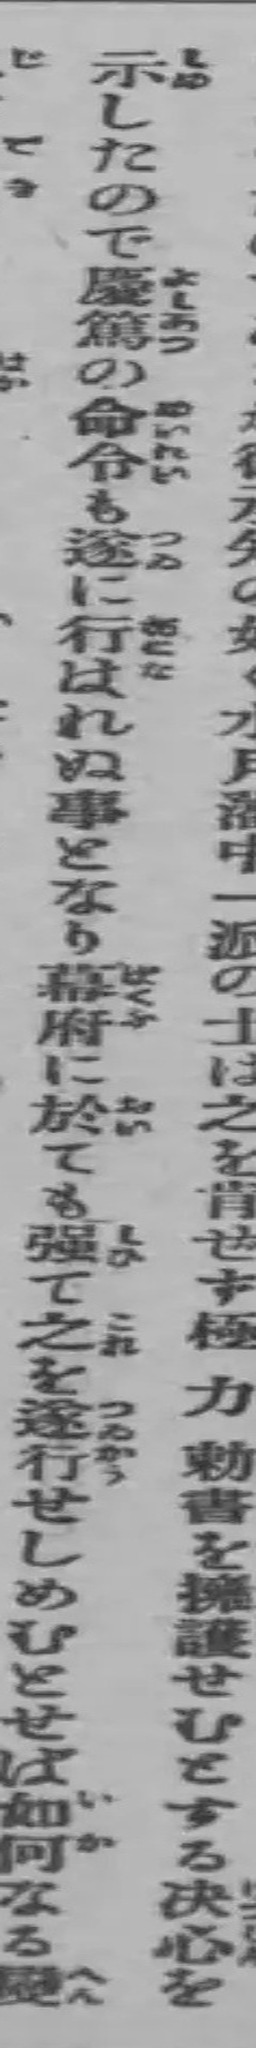示したので慶篤の命令も遂に行はれぬ事となり幕府に於ても強て之を遂行せしめむとせば如何なる変
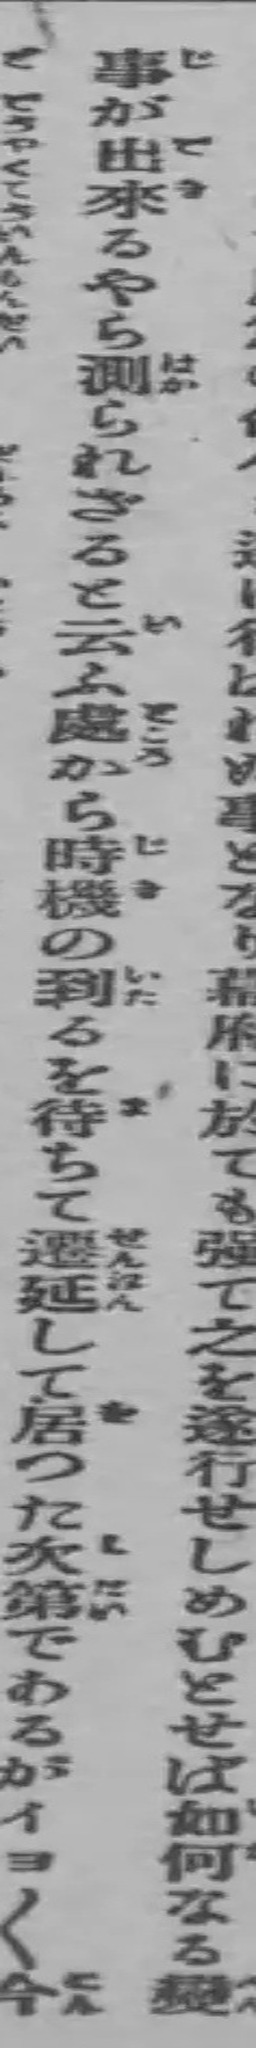事が出来るやら測られざると云ふ処から時機の到るを待ちて遷延して居つた次第であるがイヨ〳〵今
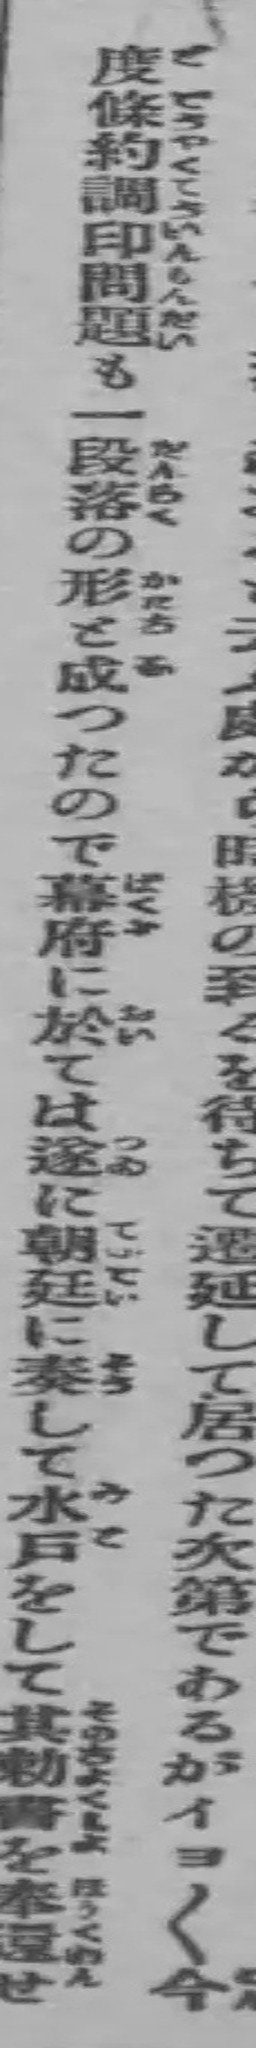度条約調印問題も一段落の形と成つたので幕府に於ては遂に朝廷に奏して水戸をして其勅書を奉還せ
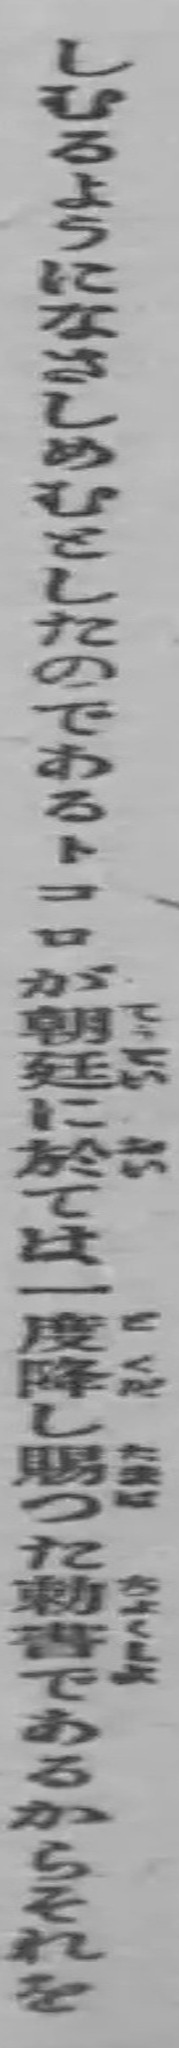しむるようになさしめむとしたのであるトコロが朝廷に於ては一度降し賜つた勅書であるからそれを
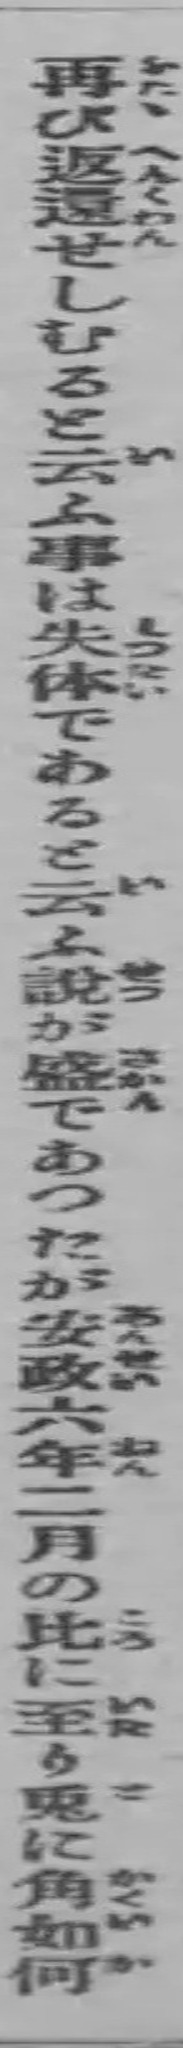再び返還せしむると云ふ事は失体であると云ふ説が盛であつたが安政六年二月の比に至り兎に角如何
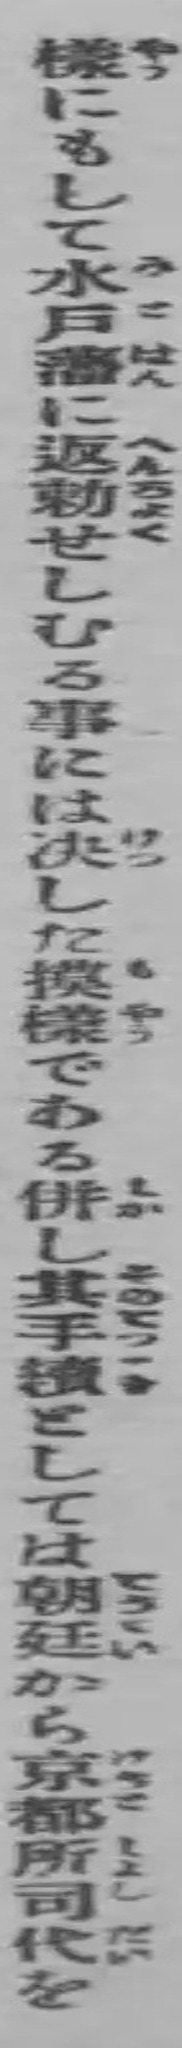様にもして水戸藩に返勅せしむる事には決した模様である併し其手続としては朝廷から京都所司代を
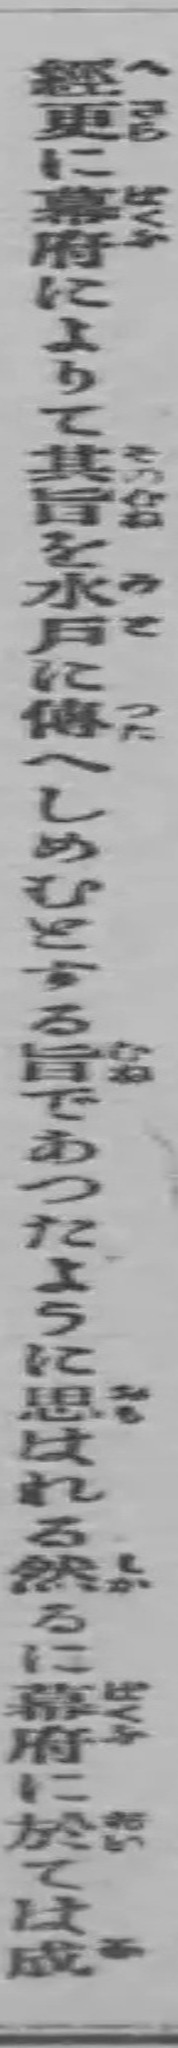経更に幕府によりて其旨を水戸に傳へしめむとする旨であつたように思はれる然るに幕府に於てな成
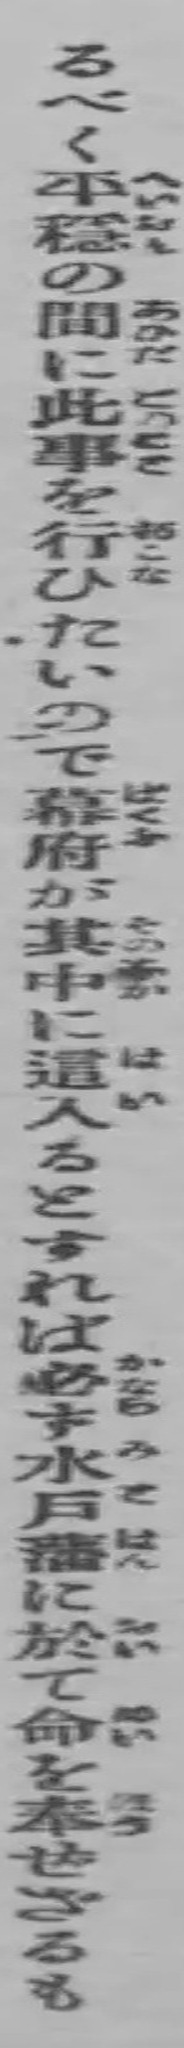るべく平穏の間に此事を行ひたいので幕府が其中に這入るとすれば必ず水戸藩に於て命を奉せざるも
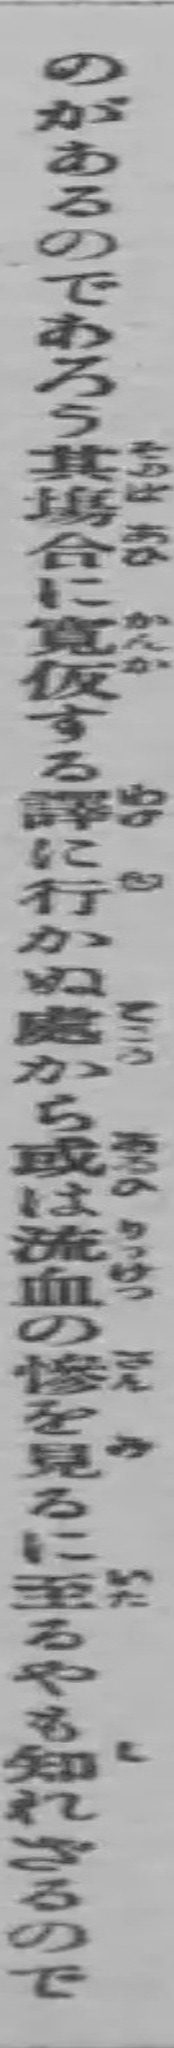のがあるのであろう其場合に寛仮する訳に行かぬ処から或は流血の惨を見るに至るやも知れざるので
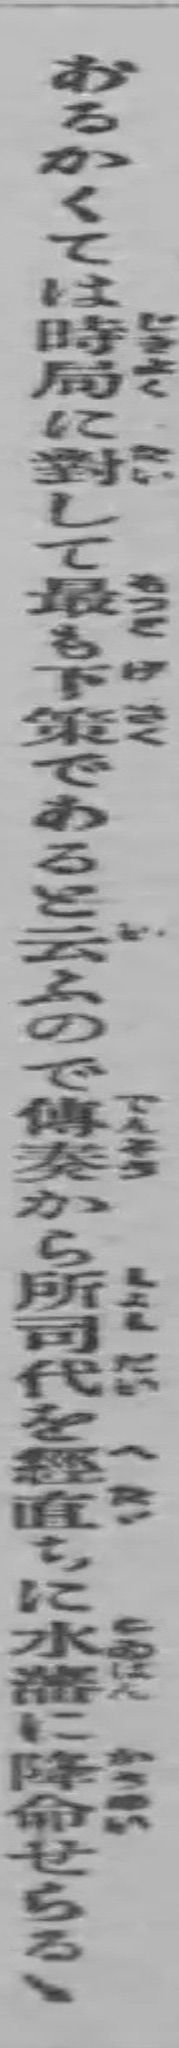あるかくては時局に対して最も下策であると云ふので伝奏から所司代を経直ちに水藩に降命せらるゝ
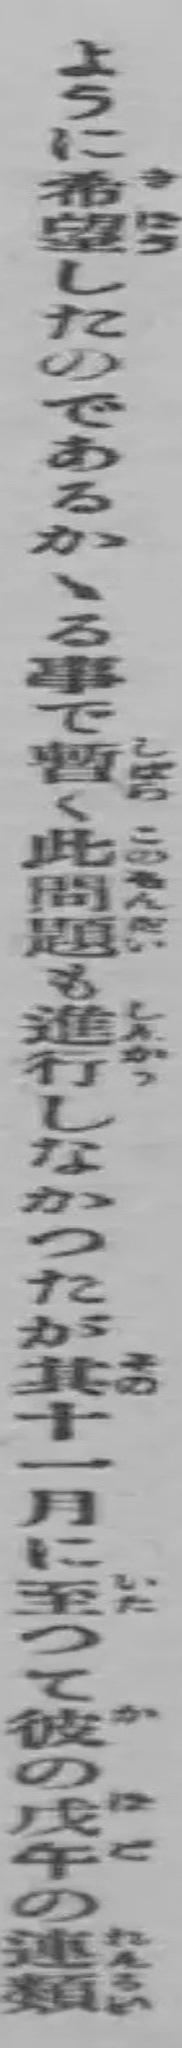ように希望したのであるかゝる事で暫く此問題も進行しなかつたのが其十一月に至つて彼の戊午の連類
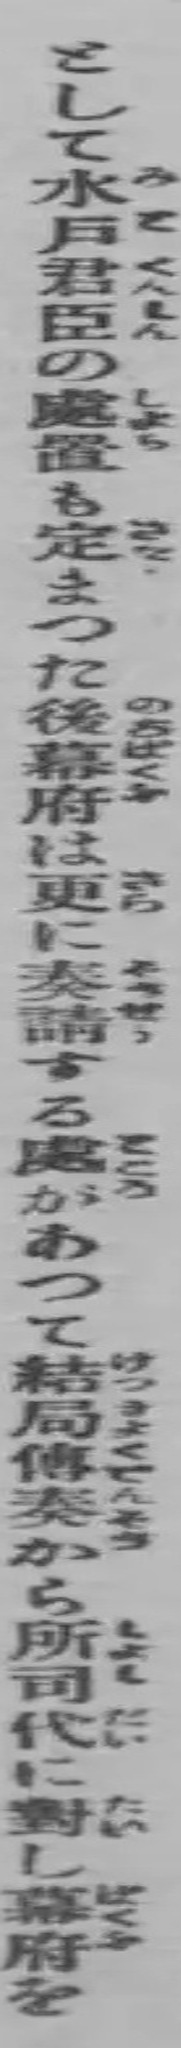として水戸君臣の処置も定まつた後幕府は更に奏請する処があつて結局伝奏から所司代に対し幕府を
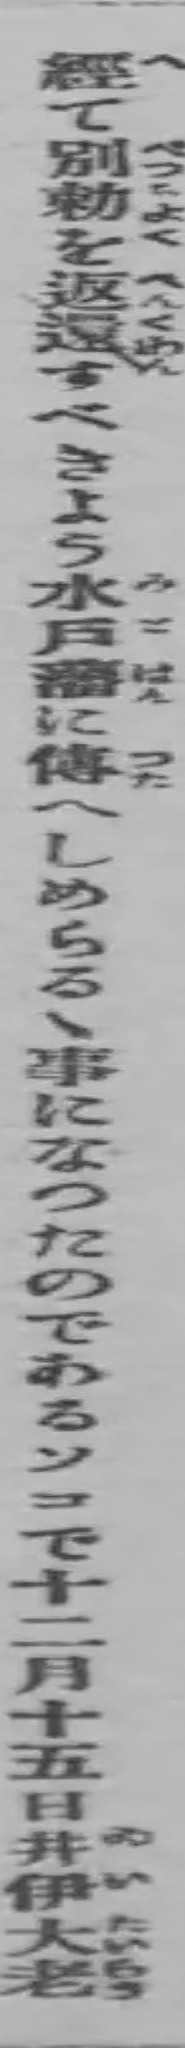経て別勅を返還すべきよう水戸藩に伝へしめらるゝ事になつたのであるソコで十二月十五日井伊大老
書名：豊橋市史談
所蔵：国立国会図書館 National Diet Library, JAPAN
